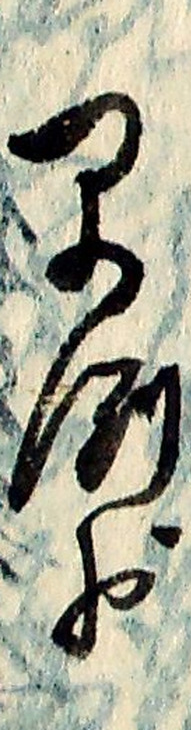早淵村
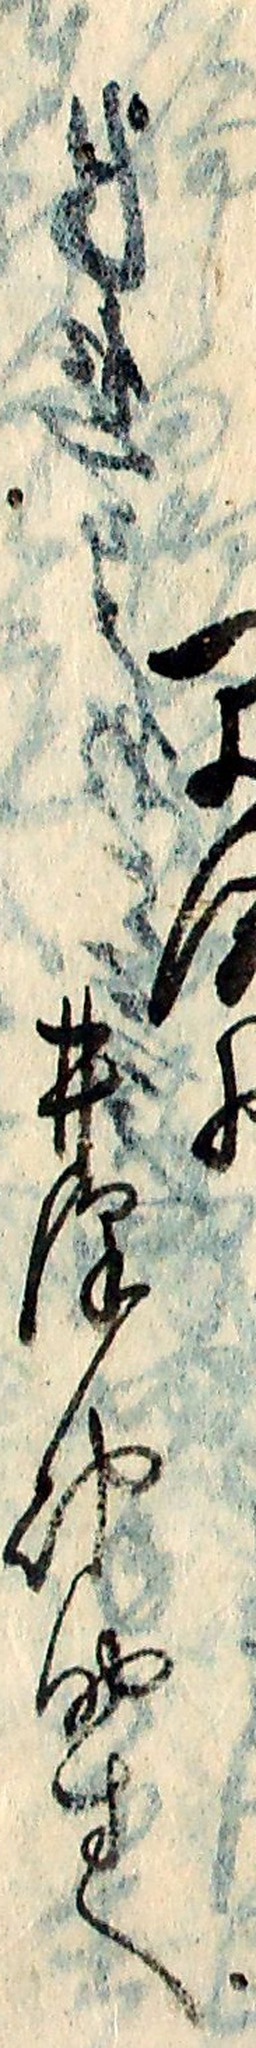伊沢仲助方へ
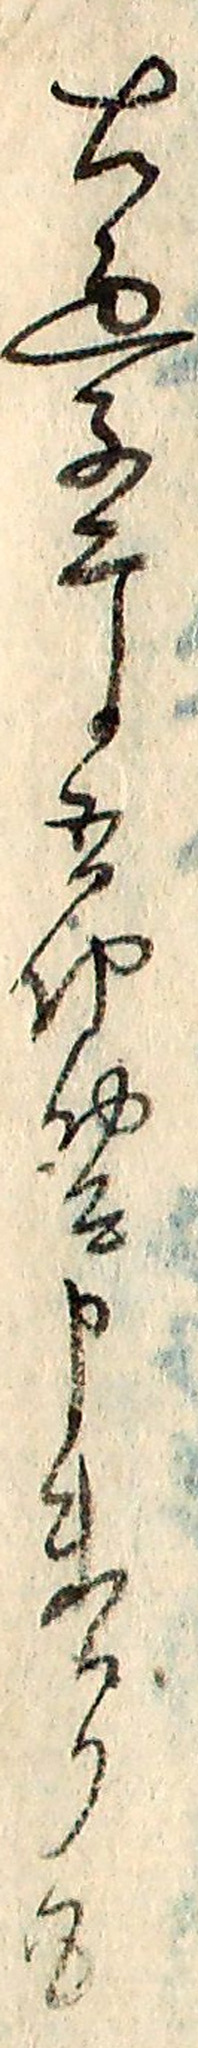右通子二月五日仲助え申来なり以上

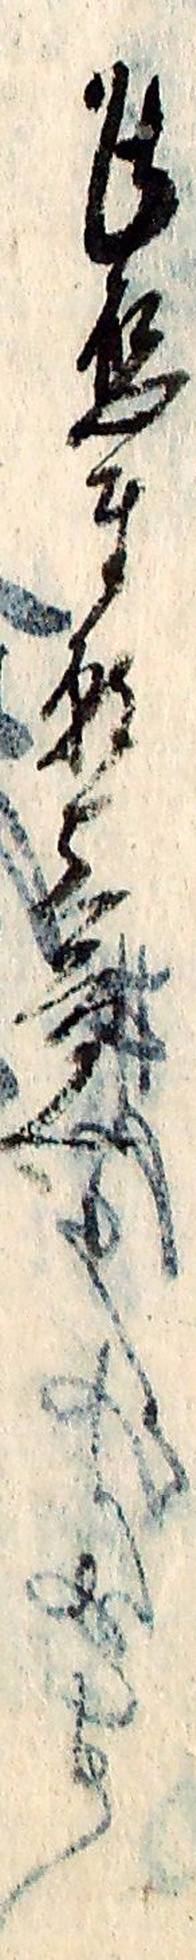乍恐奉願上覚
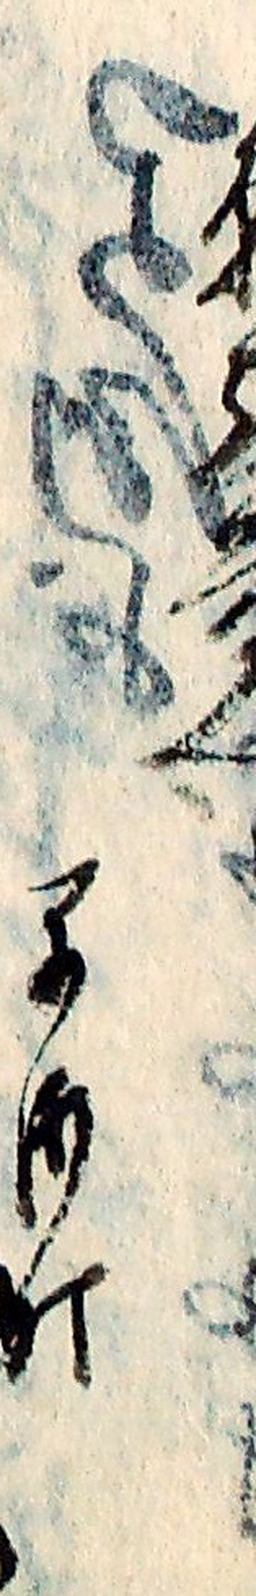早淵村
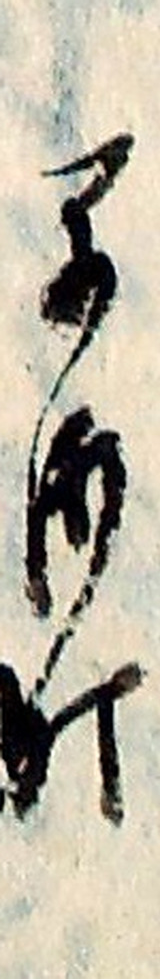早淵村
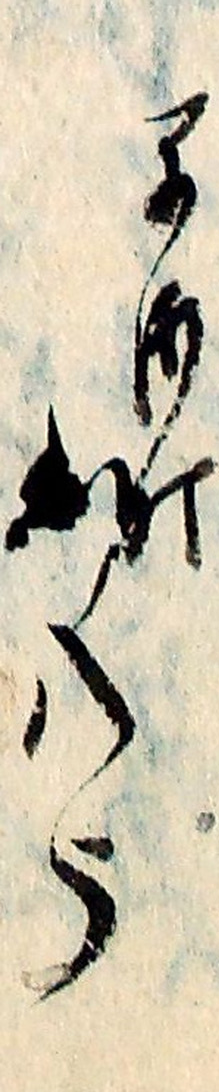早淵村
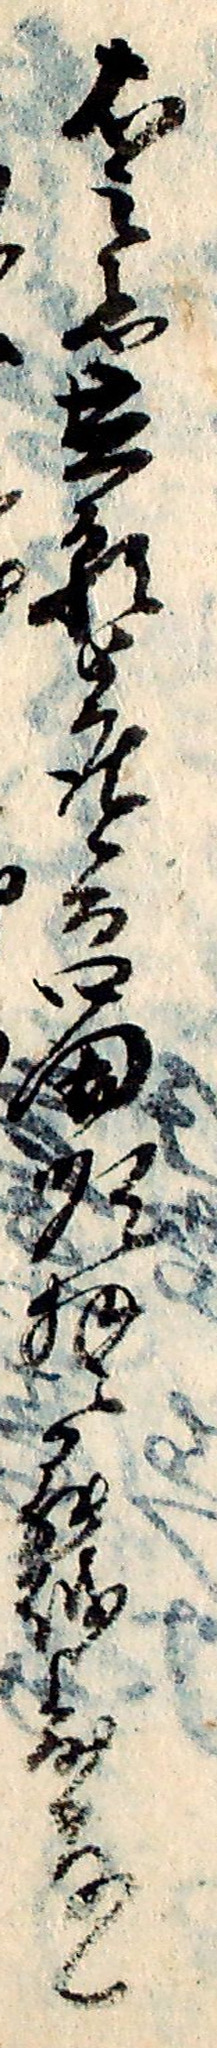右之者立願御座候て四国巡拝に罷越度奉存候
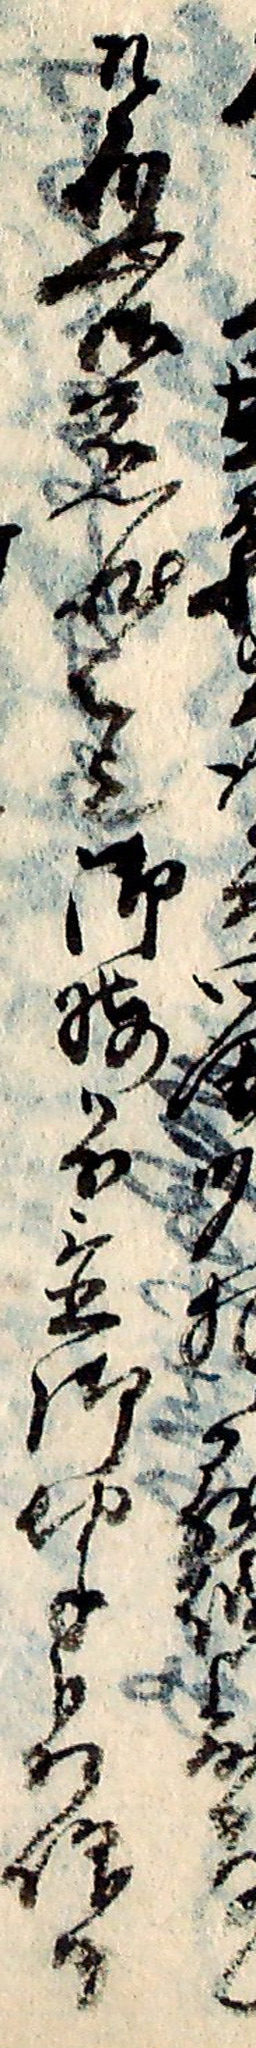乍恐御慈悲之上御暇被下置御切手被為仰付
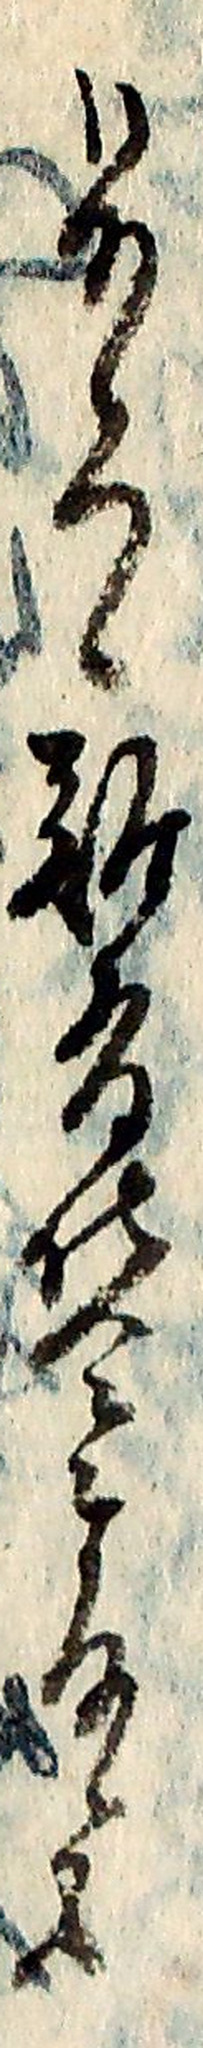被下候はゝ難有仕合奉存候以上
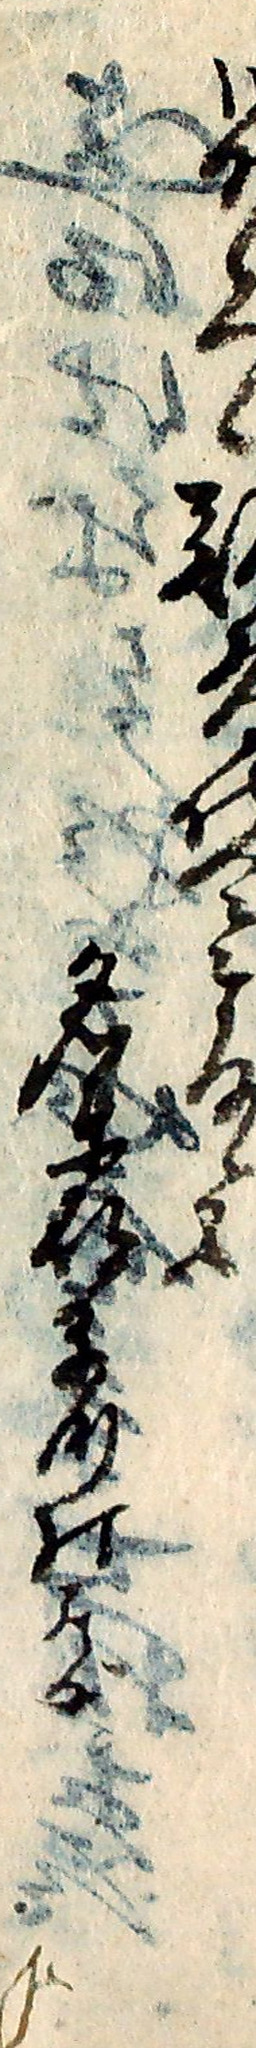名東郡早淵村庄屋
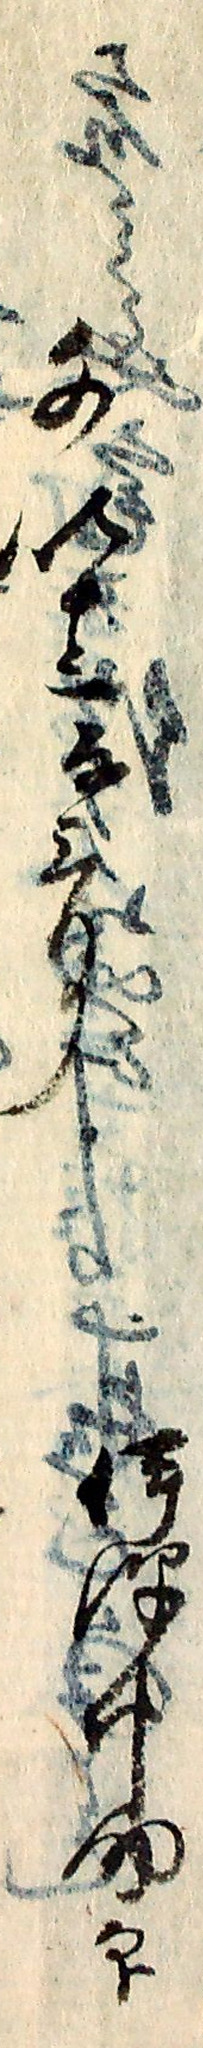文化十三子三月伊沢仲助印
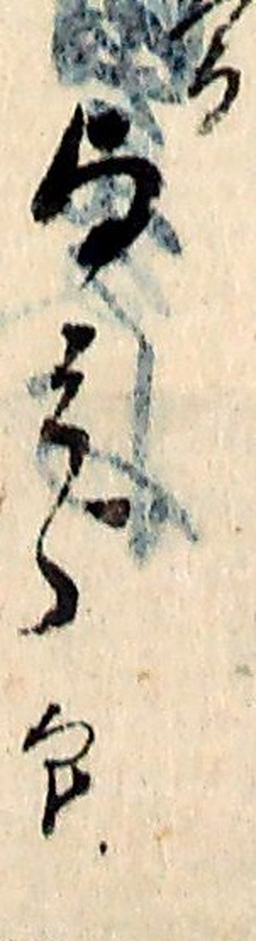与三郎印
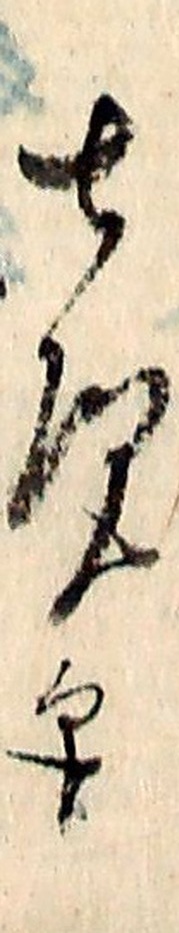七次印
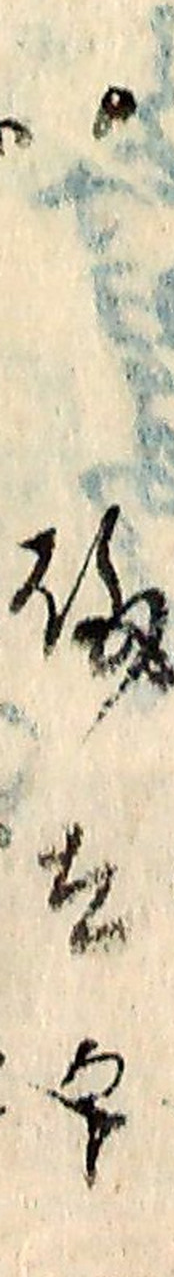磯太印
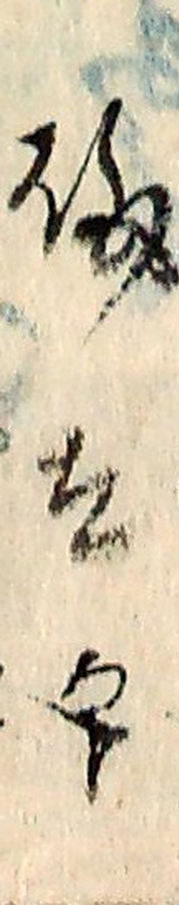磯太印
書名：諸御願書控(後藤氏壱番）
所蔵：鳴門教育大学 Naruto University of Education
